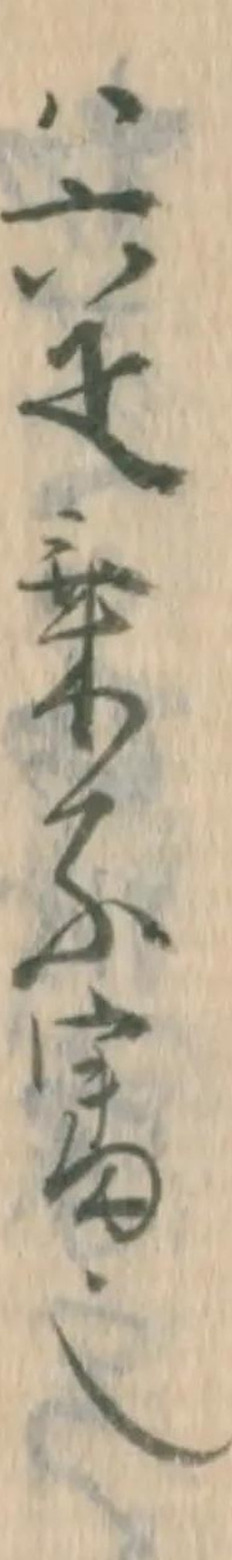ハ六疋乗不審也
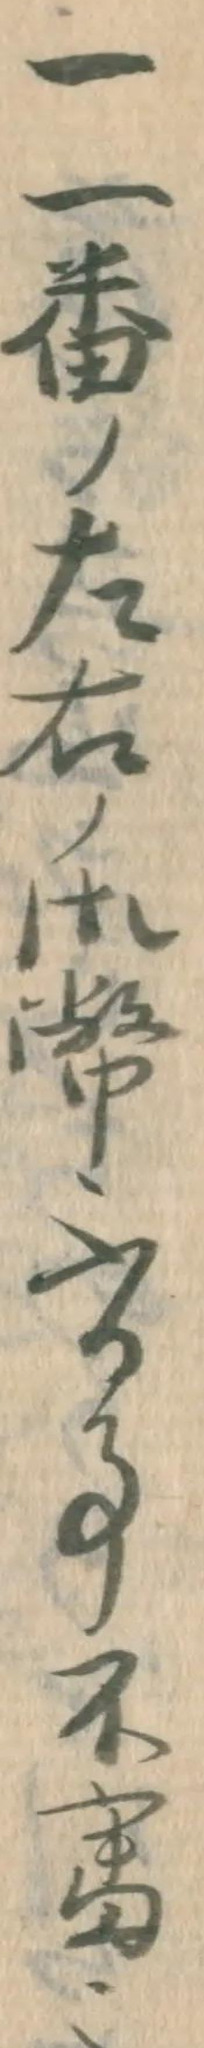一一番ノ左右ノ御幣ふる事不審也
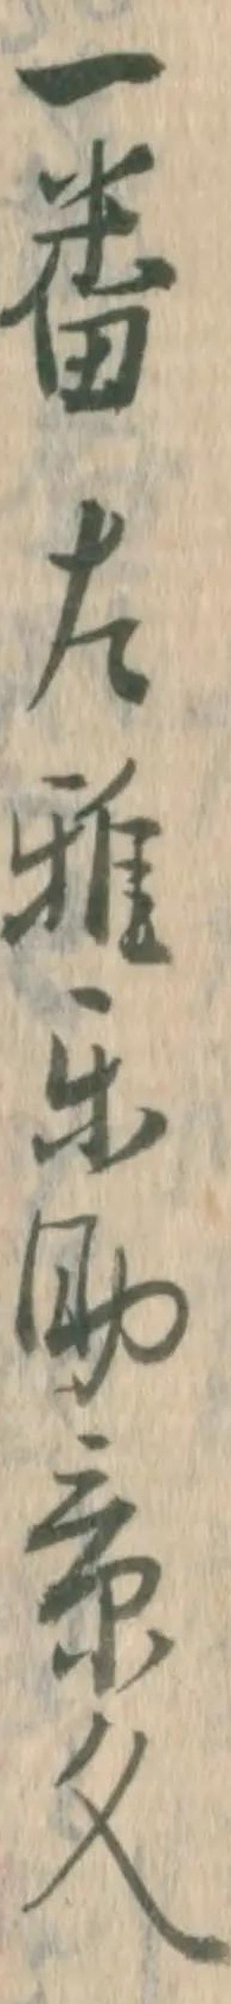一番左雅楽助景久
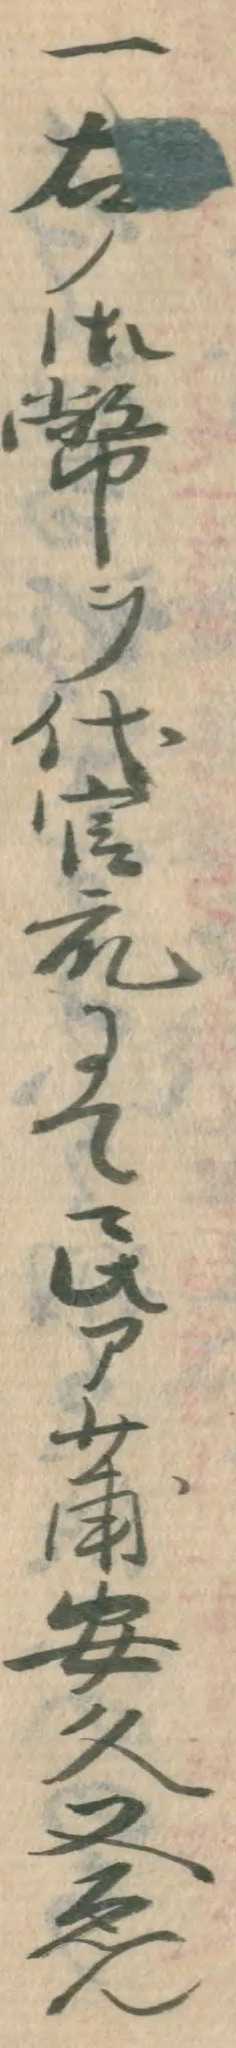一右ノ御幣ヲ代官衆にて民部少輔安久又ゑん
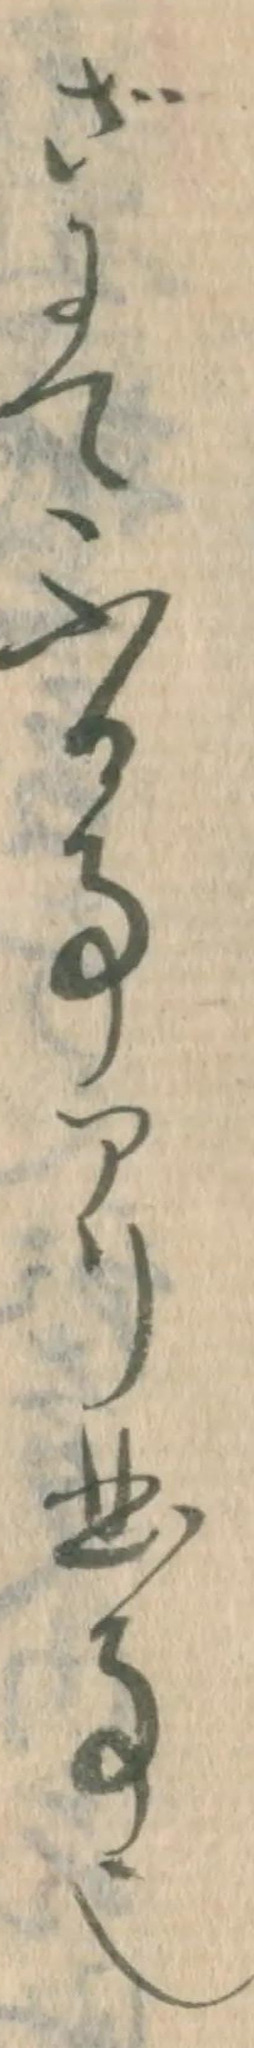ざにてふる事アリ曲事也
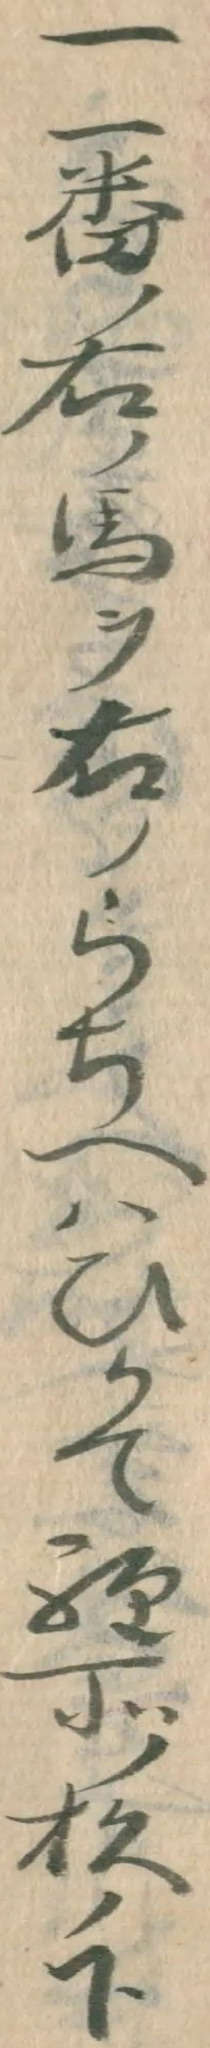一一番ノ右ノ馬ヲ右ノらちへハひかて経所ノ杉ノ下
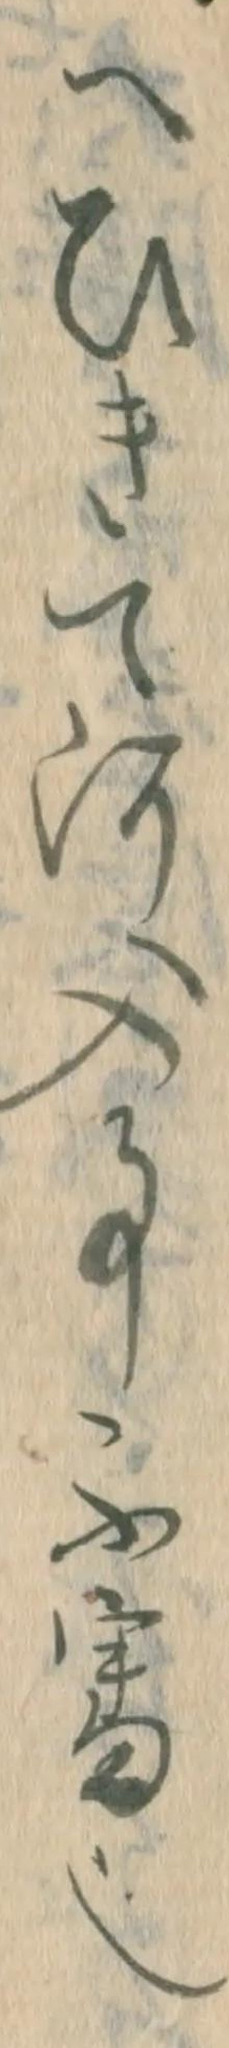へひきて河へ入事不審也
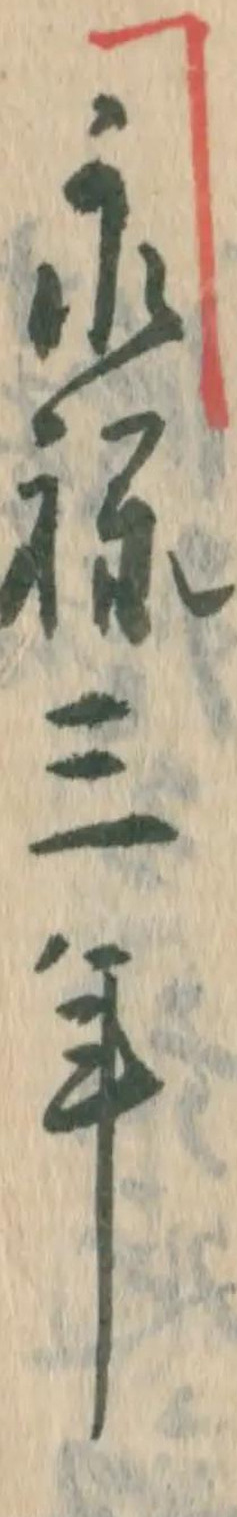永禄三年

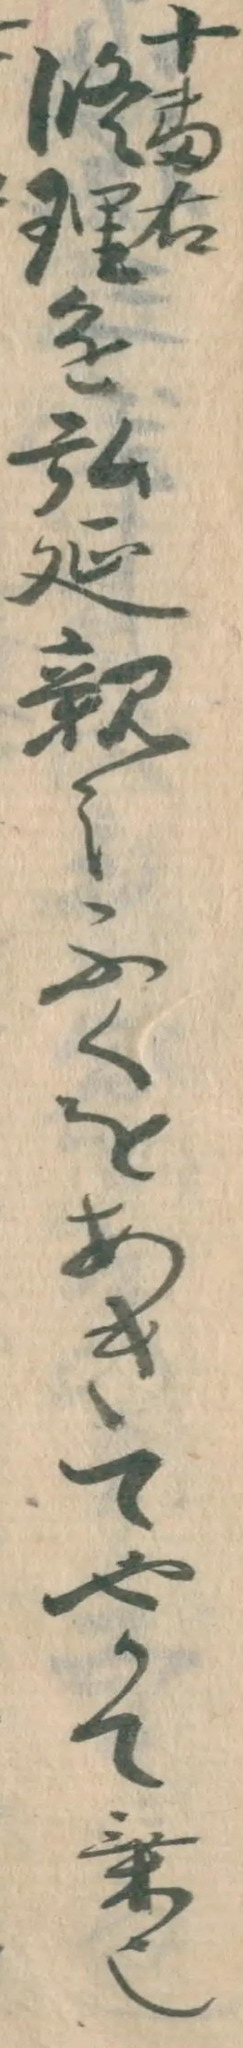修理進弘延親之ふくをあきてやかて乗也
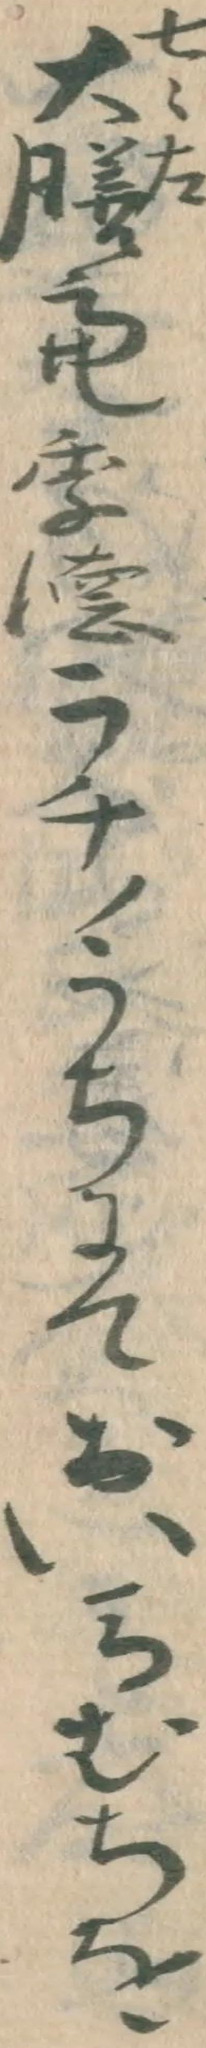大膳亮季徳ラチノうちにておい馬むちを
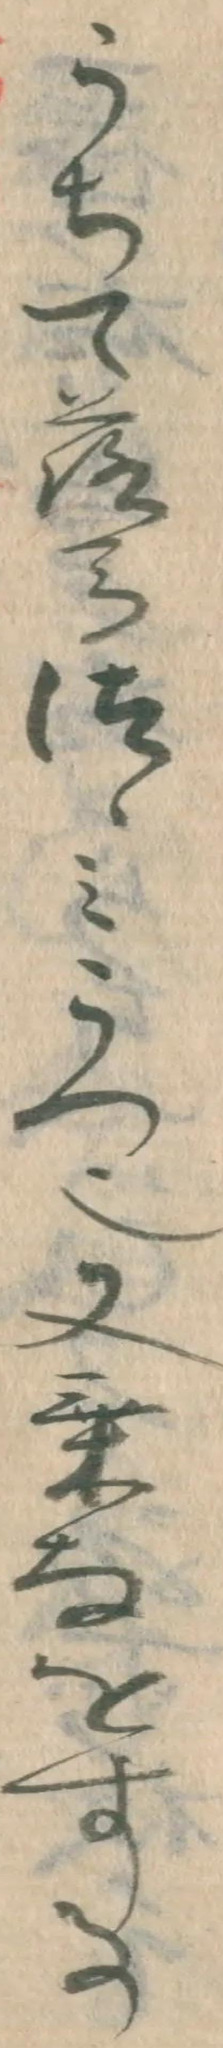うちて落馬つゝミうつ也又乗なをす事
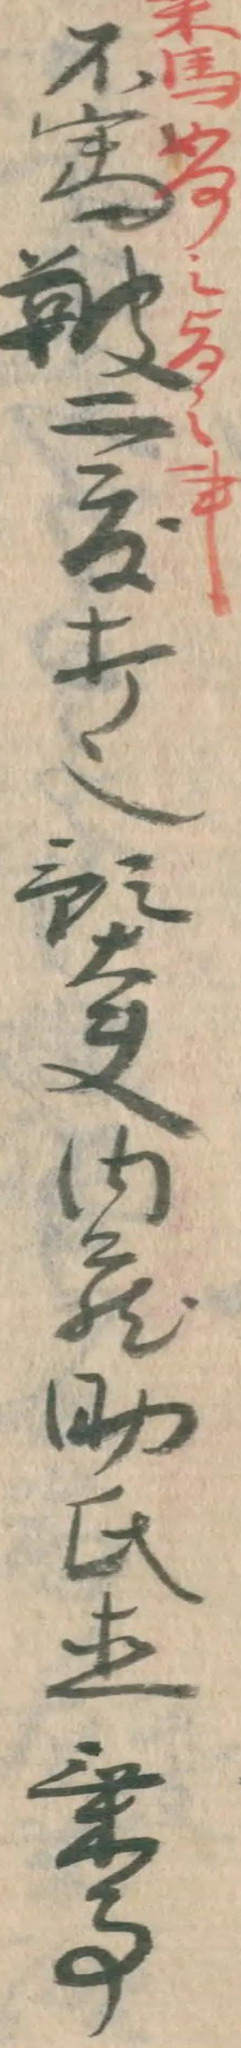不審鼓二度打也預大夫内蔵助氏直乗事
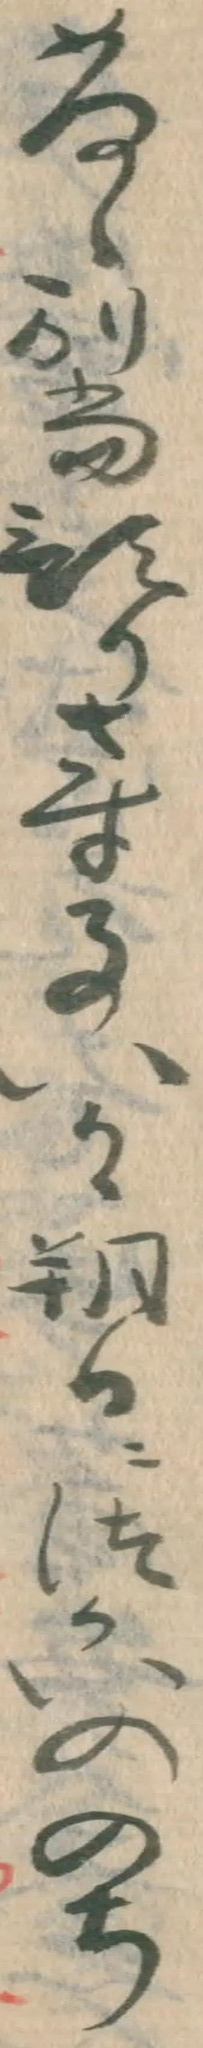如何候別当預りさす事いかゝ朔日ニつかいののち
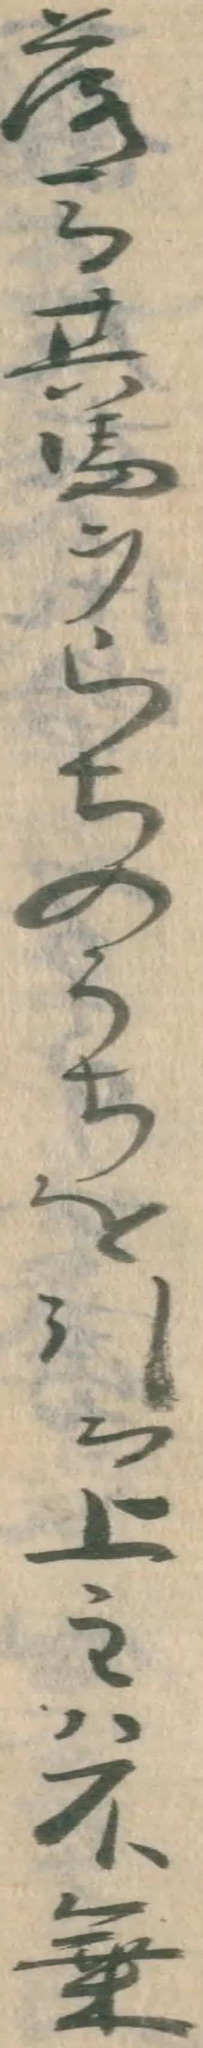落馬其馬ヲらちのうちを引而上主ハ不乗
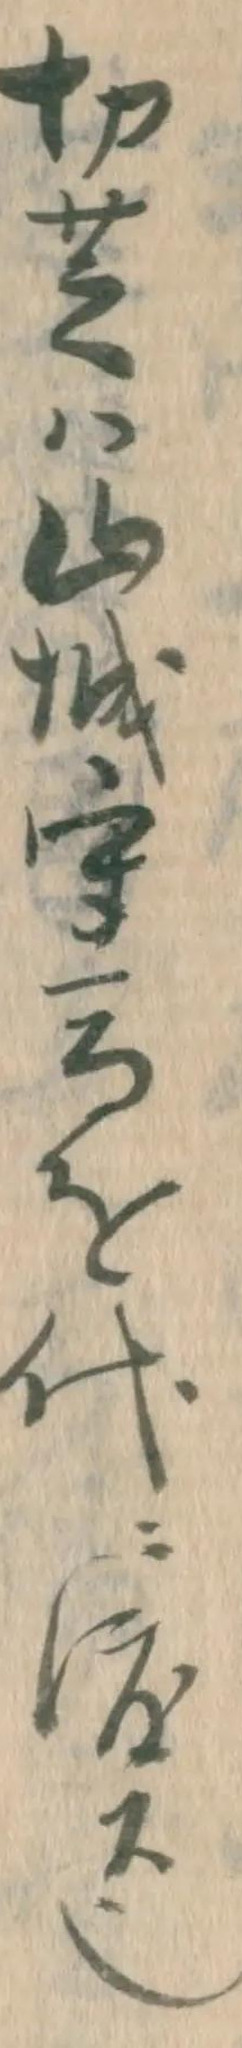切芝ハ山城守馬を代ニ渡ス也
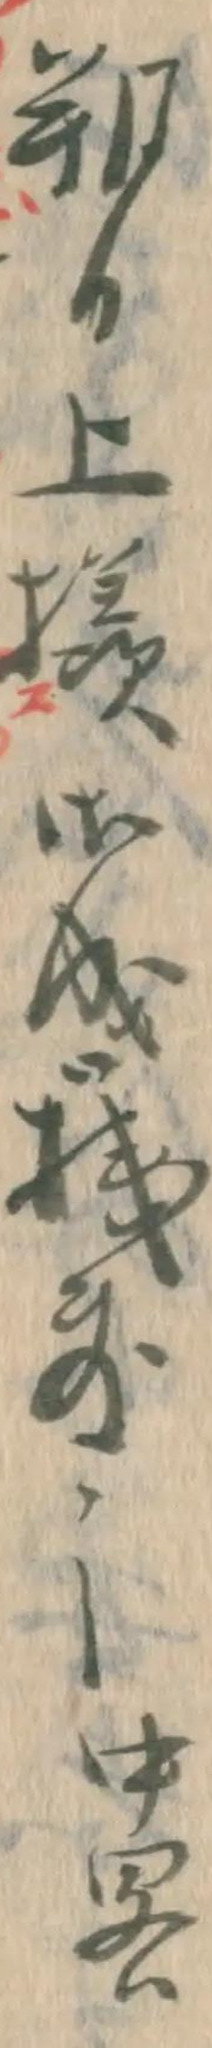朔日上様御成候桟敷❘中略
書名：賀茂社記録. 第10冊
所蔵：国立国会図書館 National Diet Library, JAPAN
